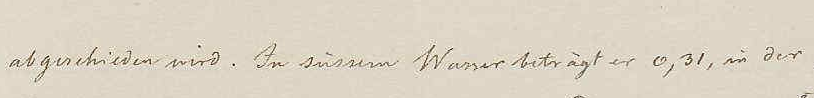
abgeschieden wird. In süssem Wasser beträgt er 0,31, in der
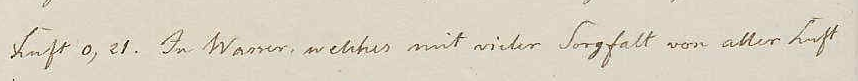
Luft 0,21. In Wasser, welches mit vieler Sorgfalt von aller Luft
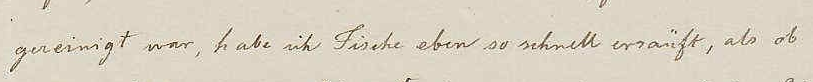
gereinigt war, habe ich Fische eben so schnell ersäuft, als ob
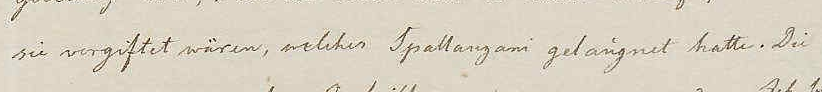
sie vergiftet wären, welches Spallanzani geläugnet hatte. Die
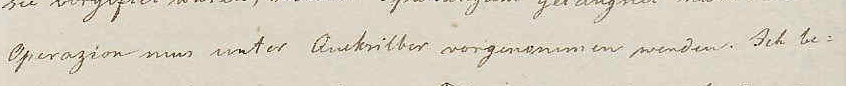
Operazion mus unter Queksilber vorgenommen werden. Ich be-
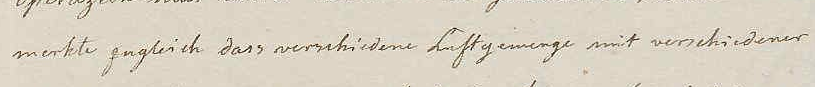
merkte zugleich dass verschiedene Luftgemenge mit verschiedener
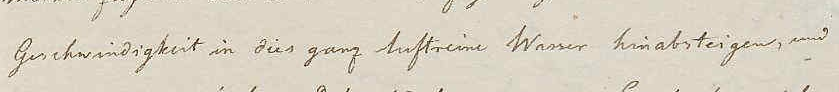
Geschwindigkeit in dies ganz luftreine Wasser hinabsteigen, und
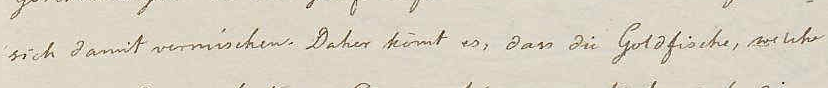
sich damit vermischen. Daher komt es, dass die Goldfische, welche
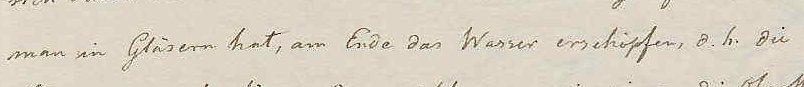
man in Gläsern hat, am Ende das Wasser erschöpfen, d. h. die
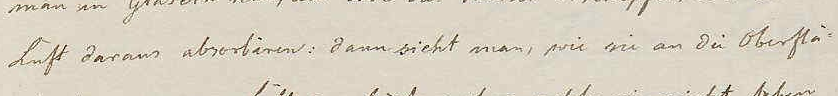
Luft daraus absorbiren: dann sieht man, wie sie an die Oberflä-
